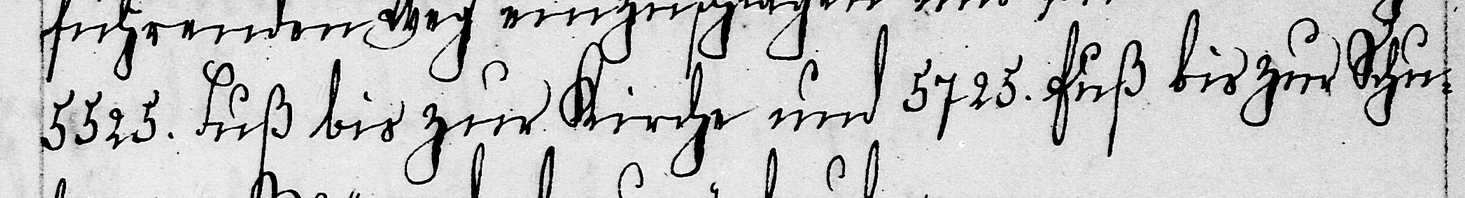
5525. Fuß bis zur Kirche und 5725. Fuß bis zur Schu¬
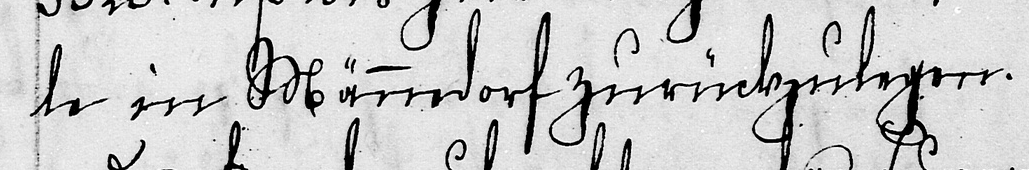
le in Männedorf zurückzulegen.
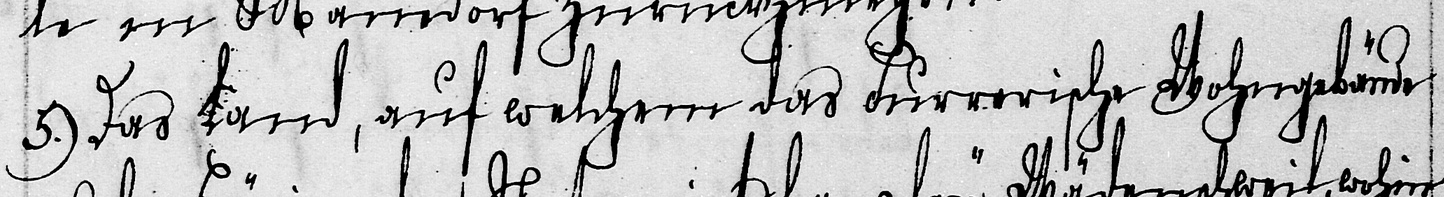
5.) Das Land, auf welchem das Furrerische Wohngebäude
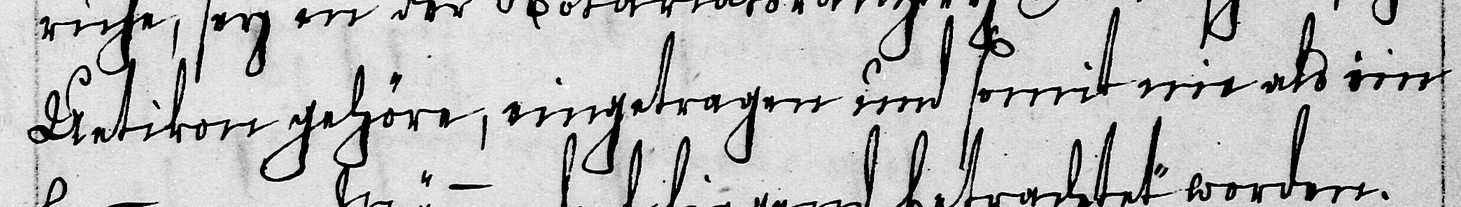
Uetikon gehöre, eingetragen und somit nie als ein
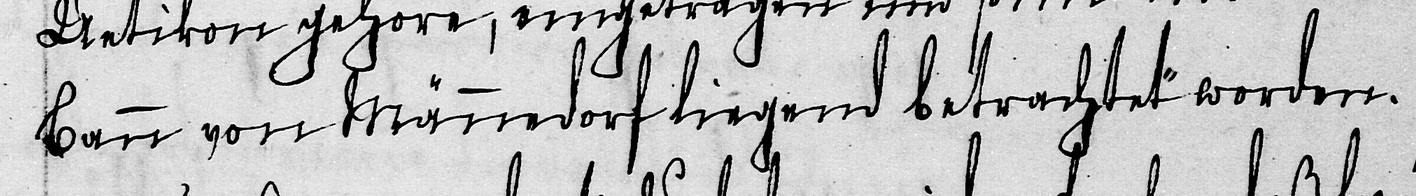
Bann von Männedorf liegend betrachtet worden.
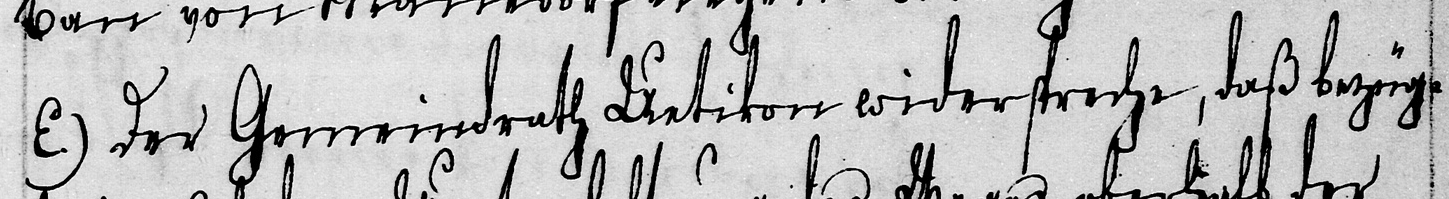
E.) Der Gemeindrath Uetikon widerspreche, daß bezüg¬
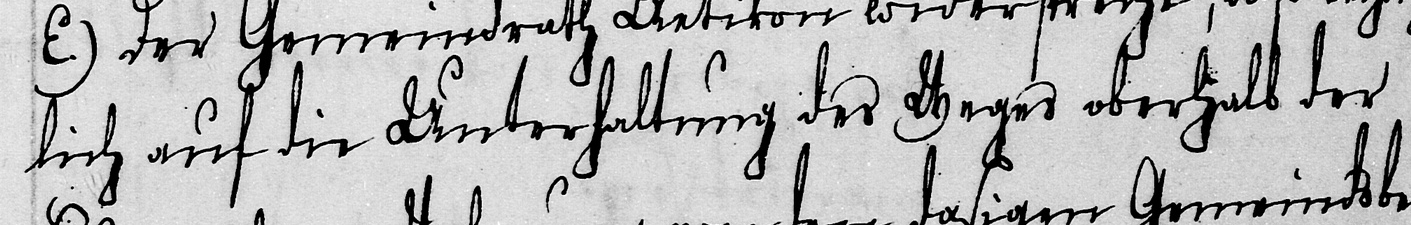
lich auf die Unterhaltung des Weges oberhalb der
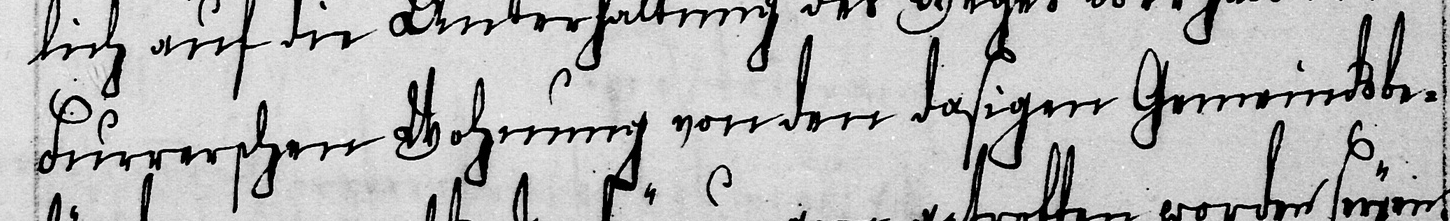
Furrerschen Wohnung von den dasigen Gemeindsbe¬
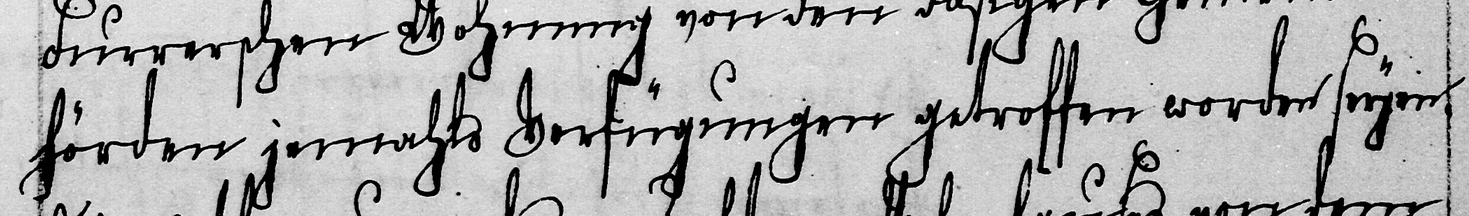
hörden jemahls Verfügungen getroffen worden seyen.
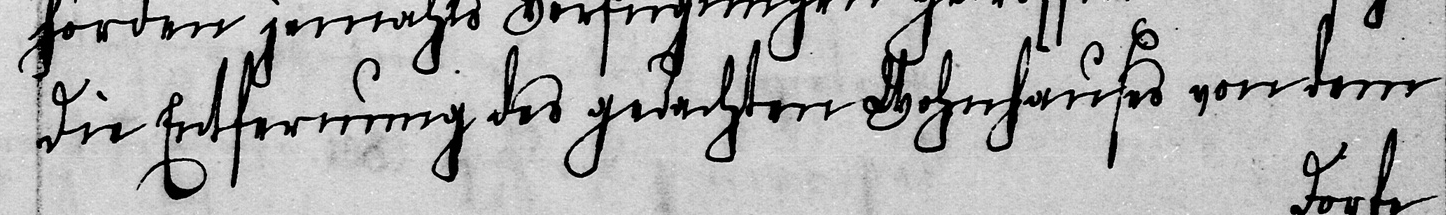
Die Entfernung des gedachten Wohnhauses von dem
